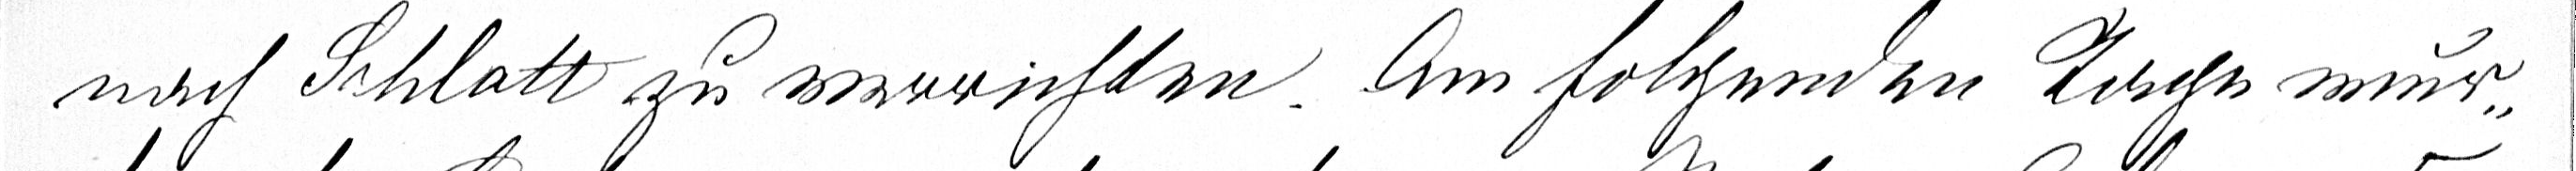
nach Schlatt zu verrichten. Am folgenden Tage wur¬
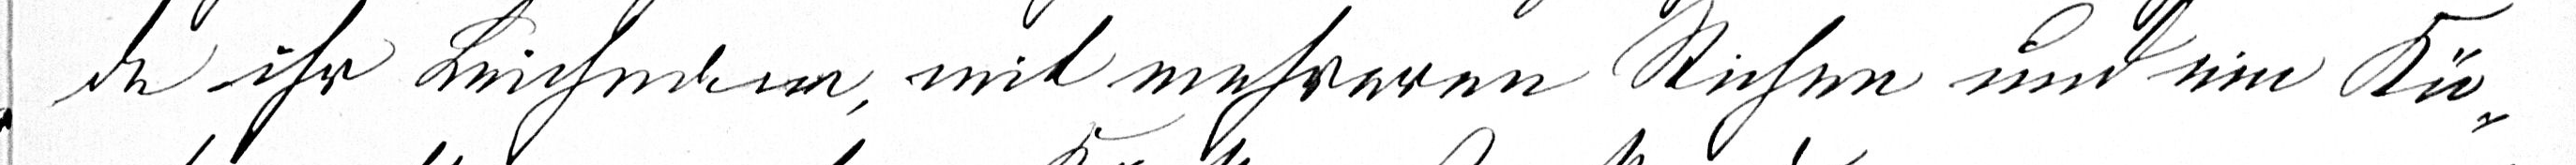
de ihr Leichnam, mit mehreren Stichen und ein Kü¬
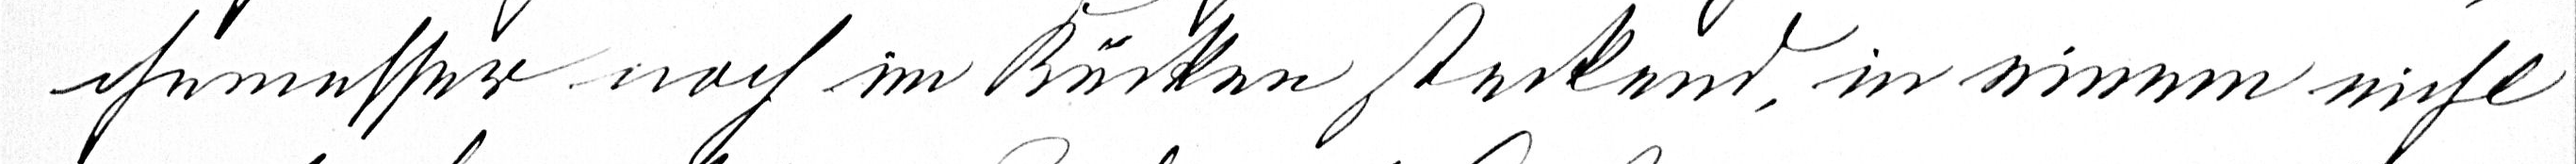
chemesser noch im Rücken steckend, in einem nicht
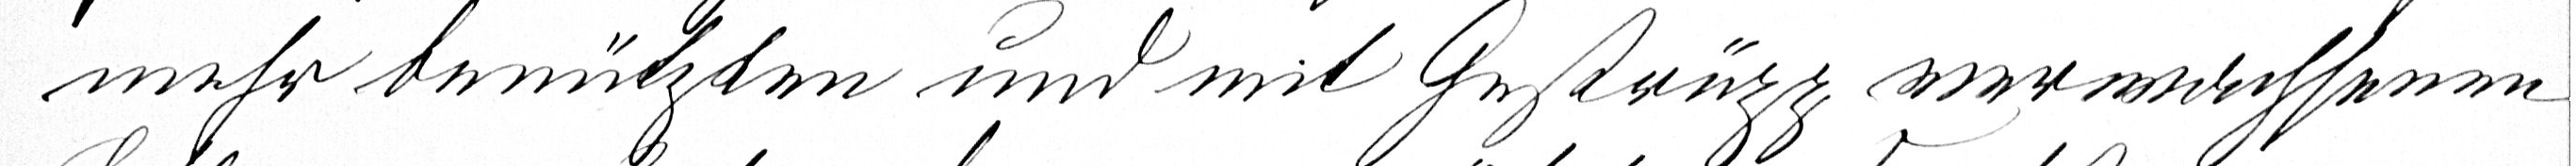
mehr benützten und mit Gestrüpp verwachsenen
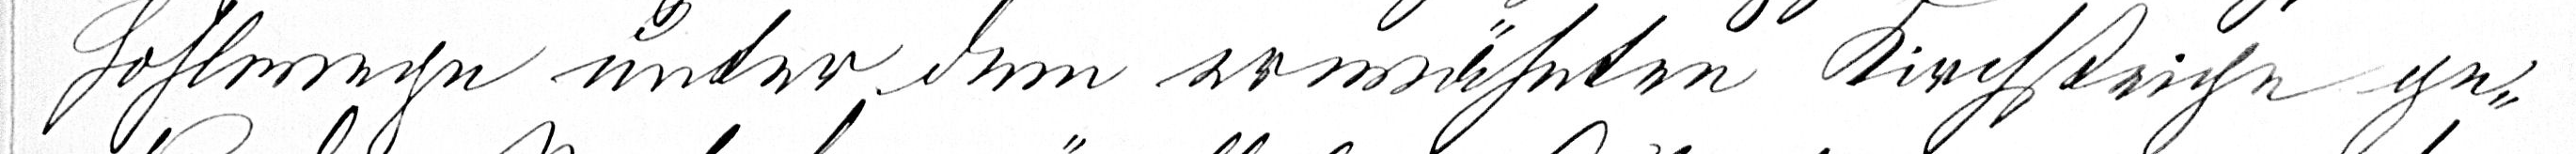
Hohlwege unter dem erwähnten Kirchteige ge¬
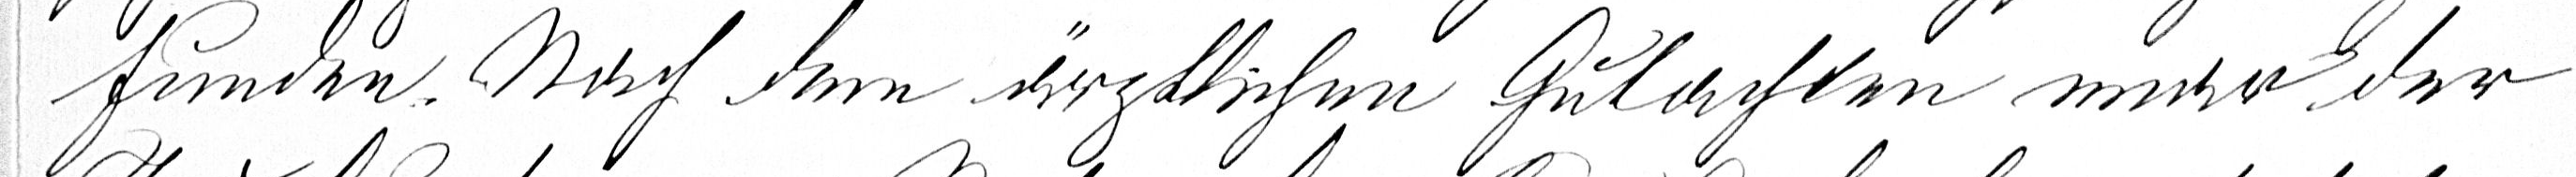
funden. Nach dem ärztlichen Gutachten war der
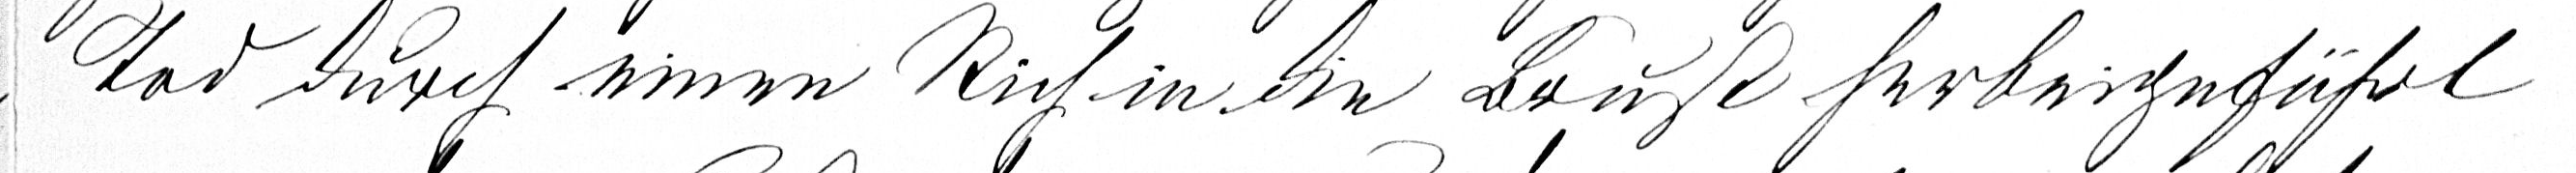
Tod durch einen Rich in die Brust herbeigeführt
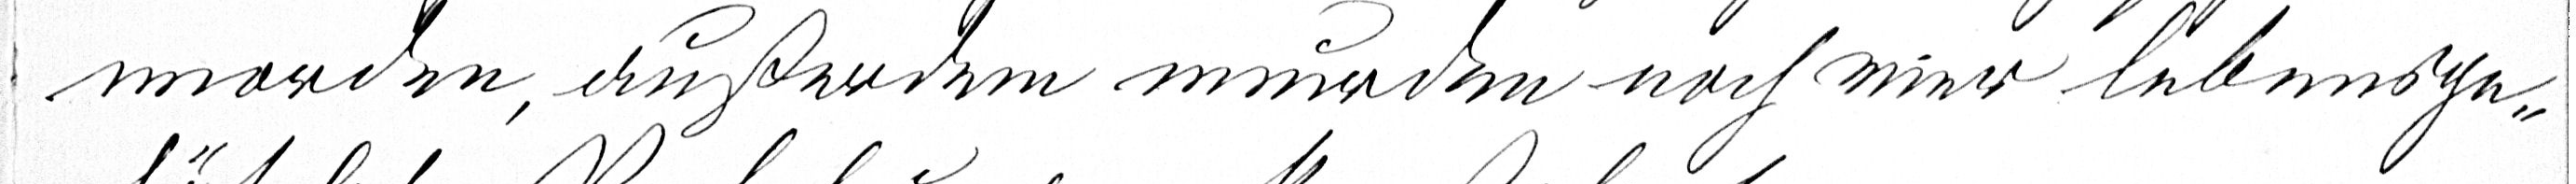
worden, außerdem wurden noch vier lebensge¬
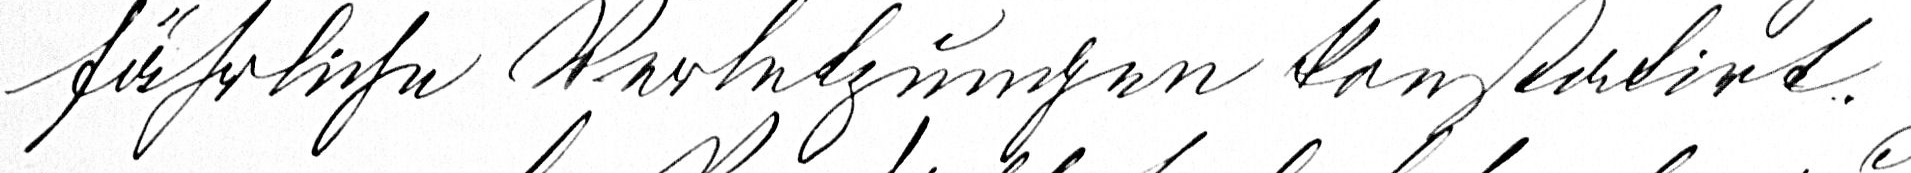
fährliche Verletzungen konstatirt.
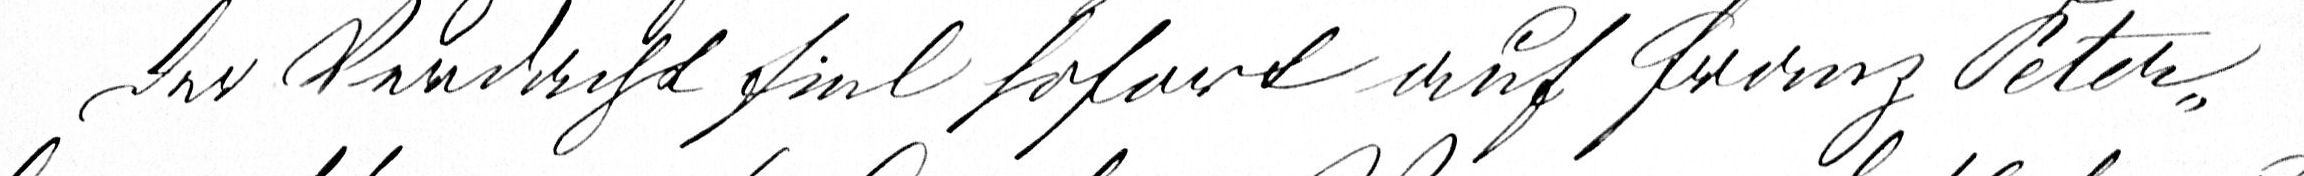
Der Verdacht fiel sofort auf Franz Peter¬
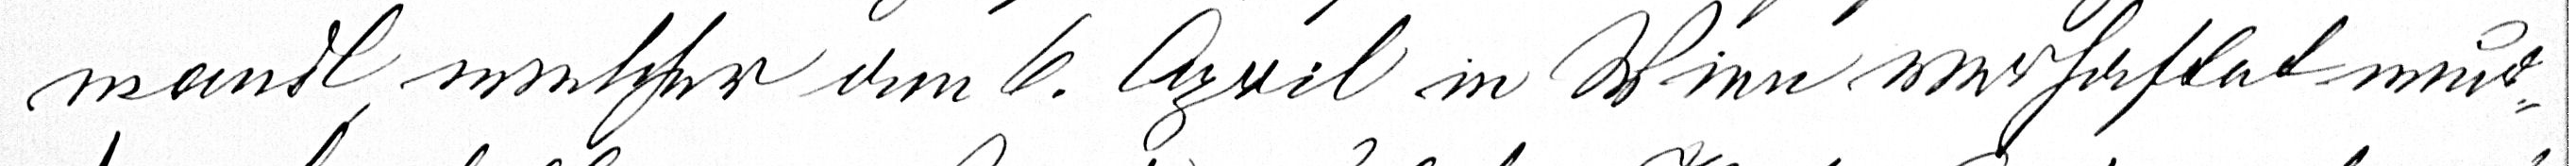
mandl welcher am 6. April in Wien verhaftet wur¬
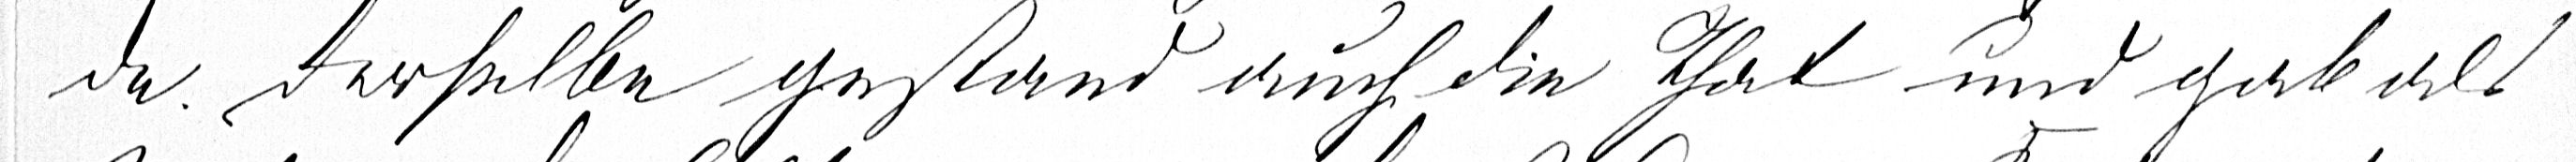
de. Derselbe gestand auch die That und gab als
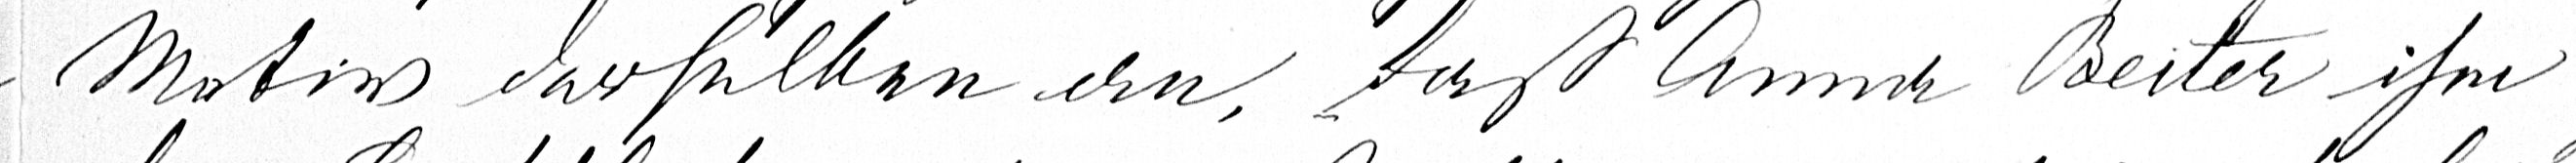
Motiv darselben an, daß Anna Beiter ihm
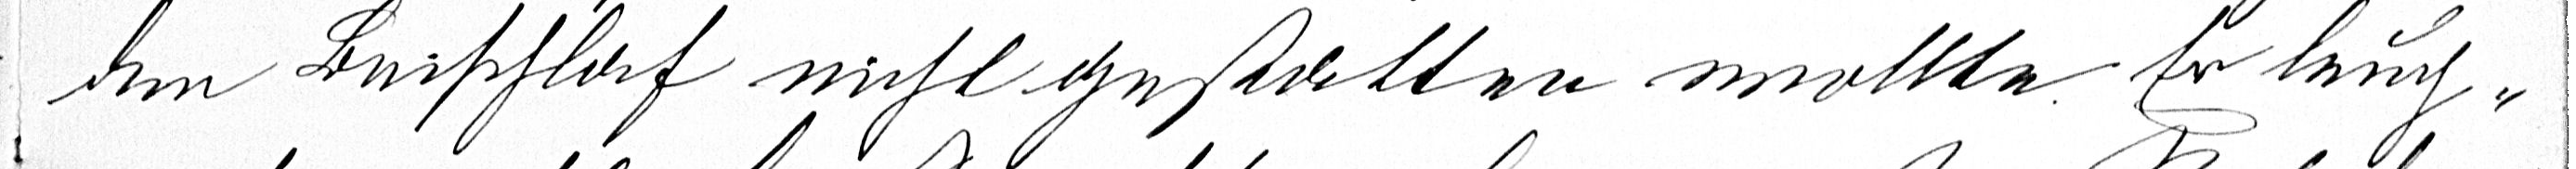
den Beischlaf nicht gestatten wollte. Er leuch¬
